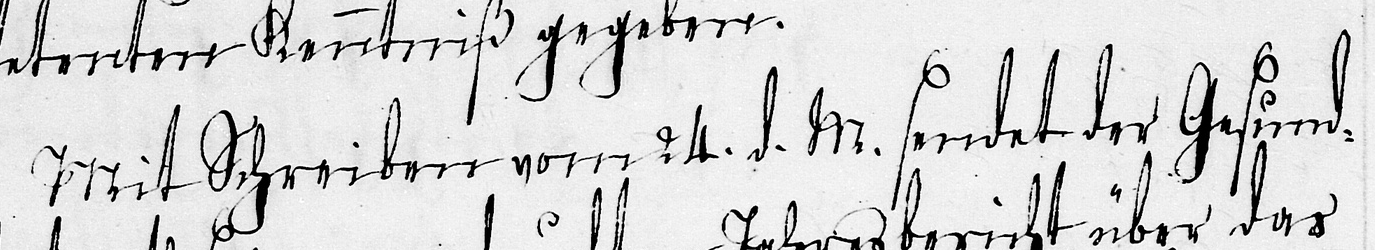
Mit Schreiben vom 24. d. M. sendet der Gesund¬
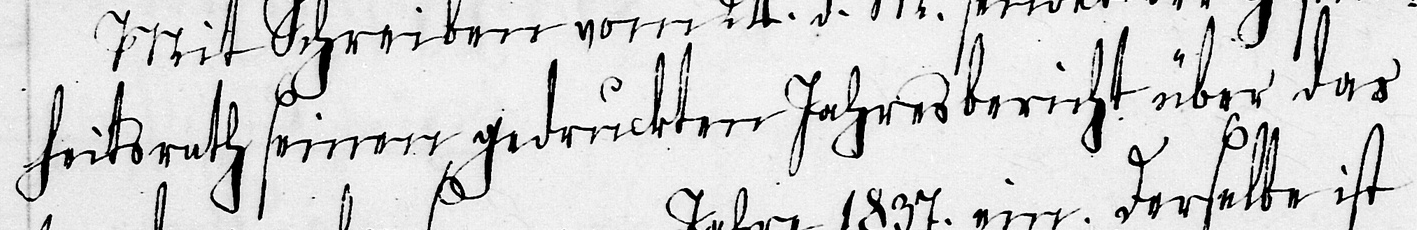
heitsrath seinen gedruckten Jahresbericht über das
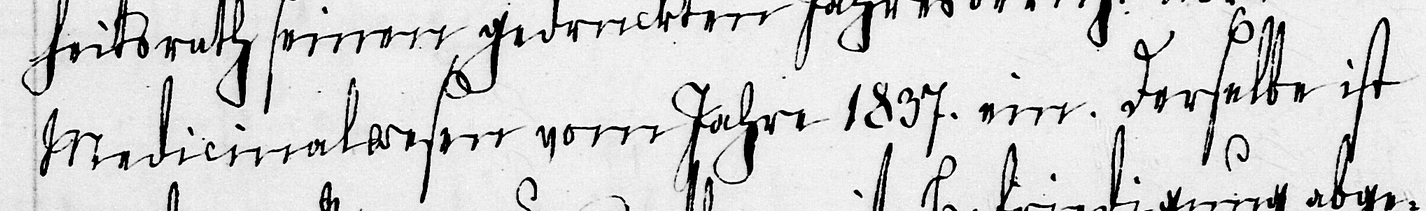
Medicinalwesen vom Jahre 1837. ein. Derselbe ist
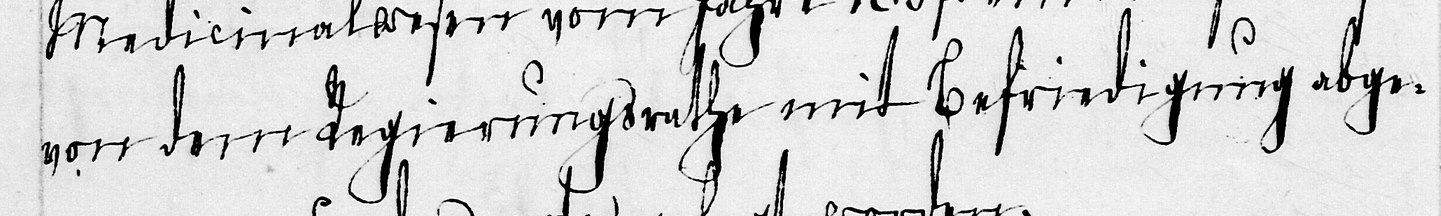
von dem Regierungsrathe mit Befriedigung abge¬
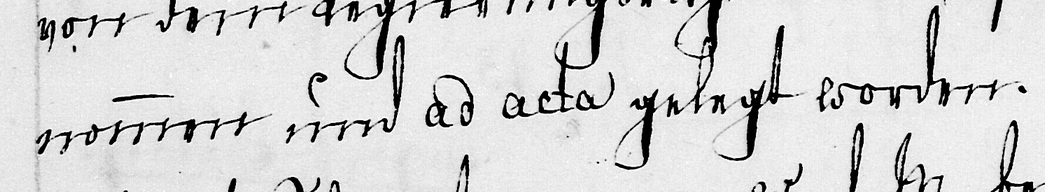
nommen und ad acta gelegt worden.
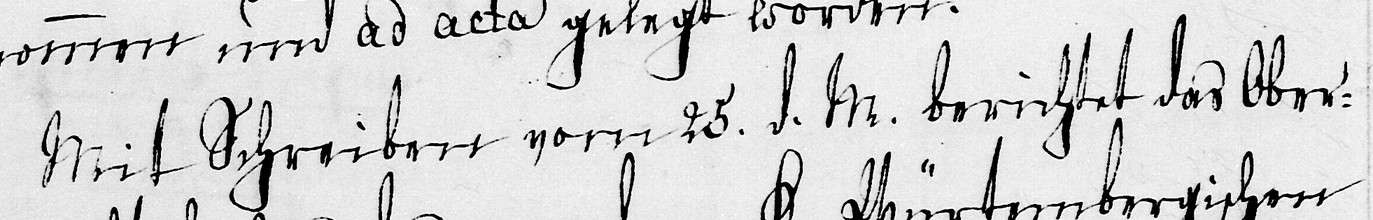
Mit Schreiben vom 25. d. M. berichtet das Ober¬
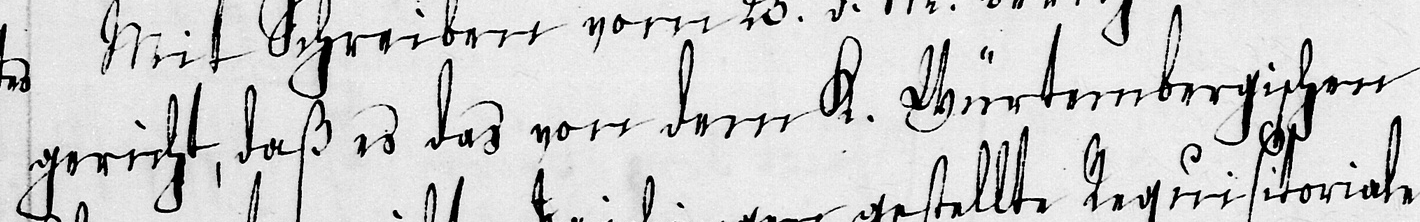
gericht, daß es das von dem K. Würtembergischen
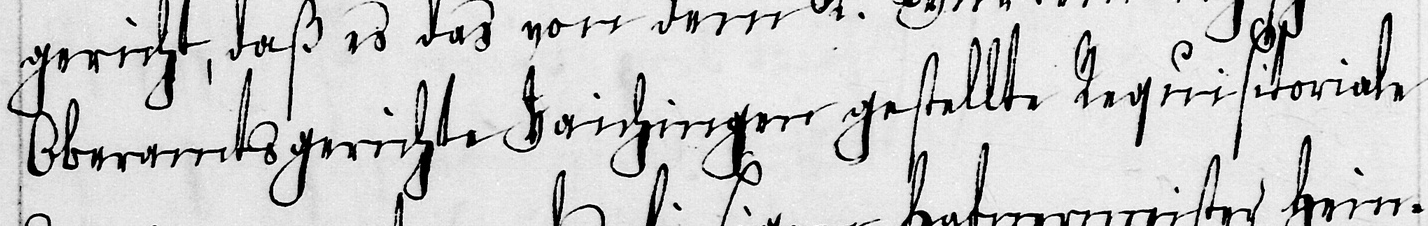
Oberamtsgerichte Vaichingen gestellte Requisitoriale
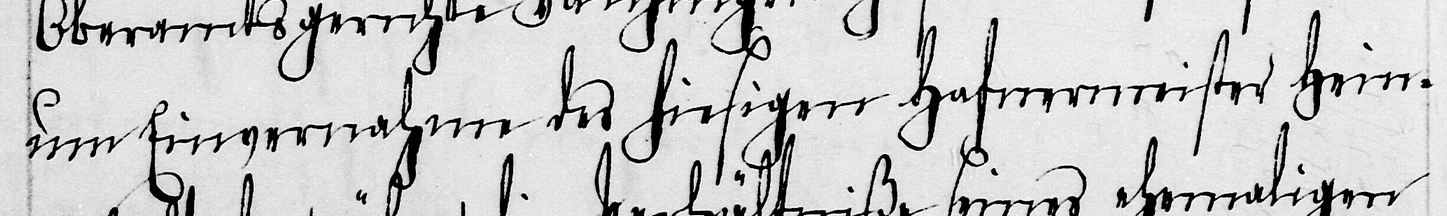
um Einvernahme des hiesigen Hafnermeister Hein¬
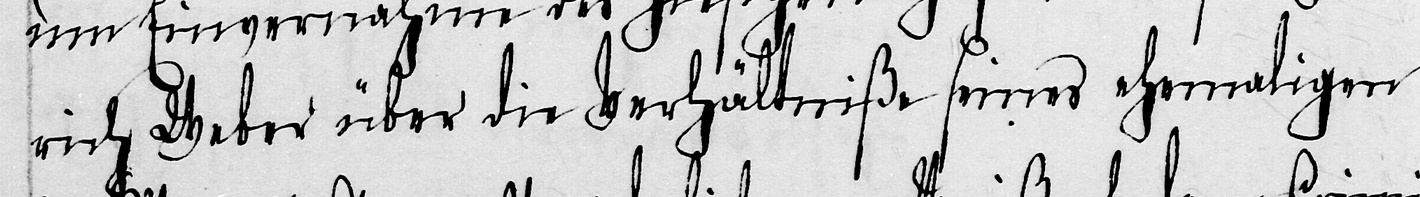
rich Weber über die Verhältniße seines ehemaligen
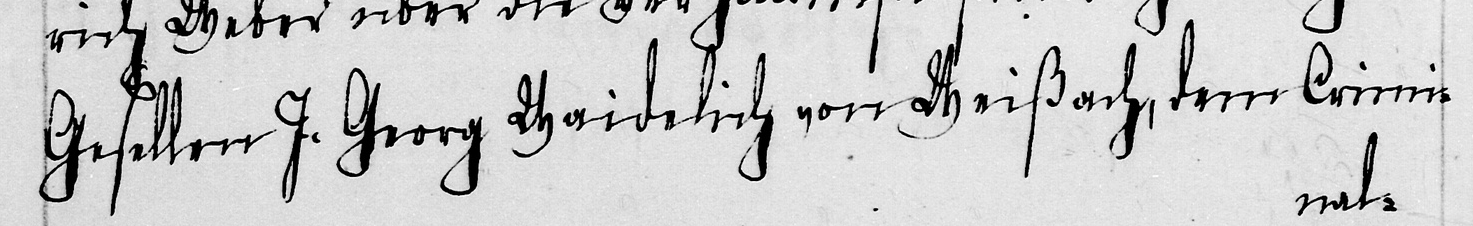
Gesellen J. Georg Waidelich von Weißach, dem Crimi-
